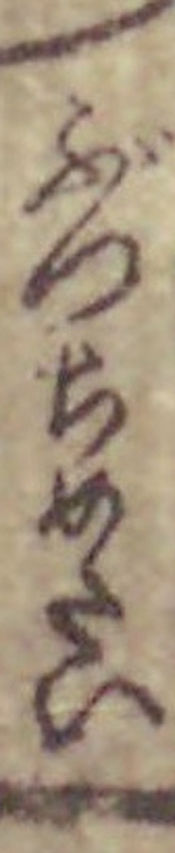ぶつちめたい
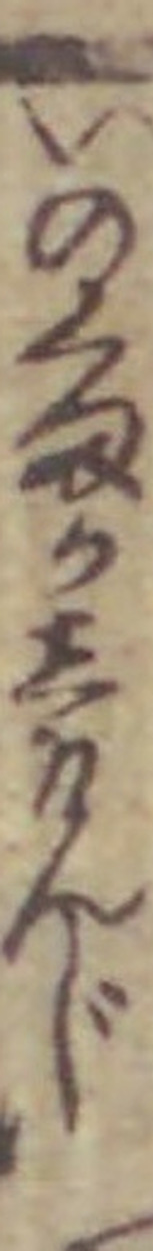いのくまかしけんじ
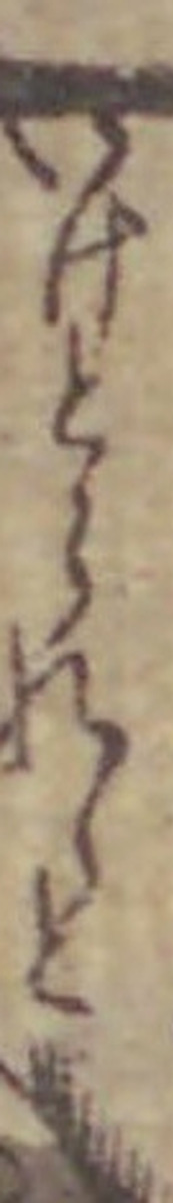いけとられしと
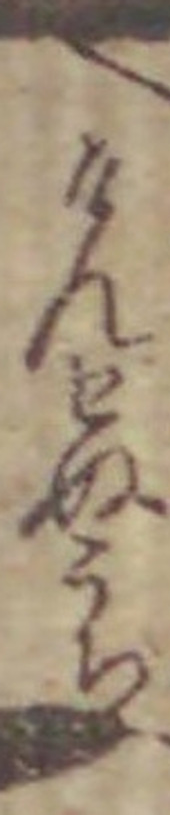けんせぬうち
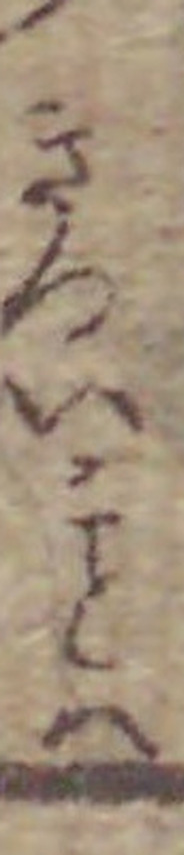きついことは
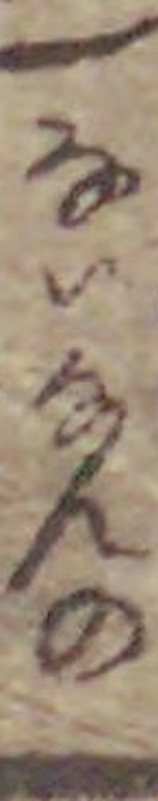ないなんの

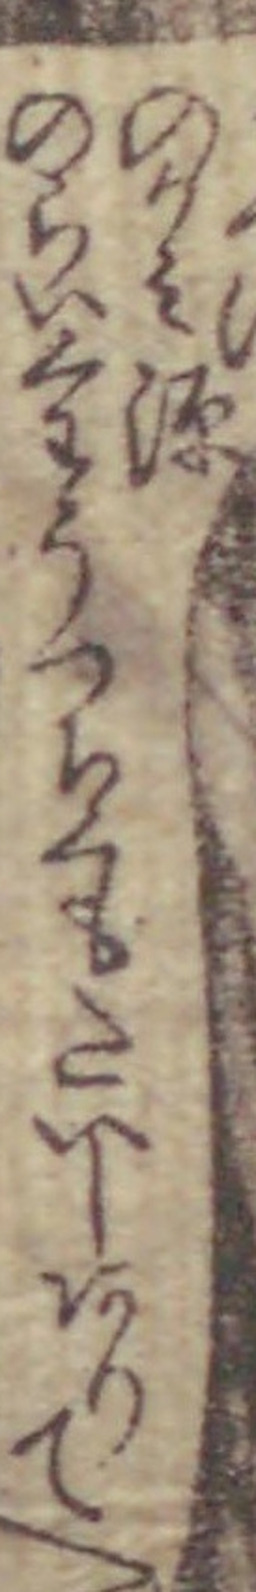のらいくわうつちくもたいしありて
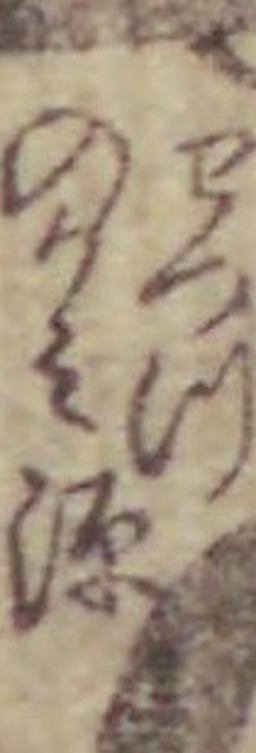のかみ源
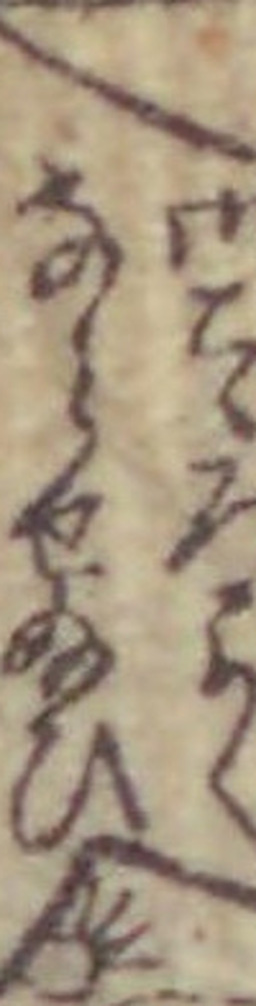ならせ給ひ
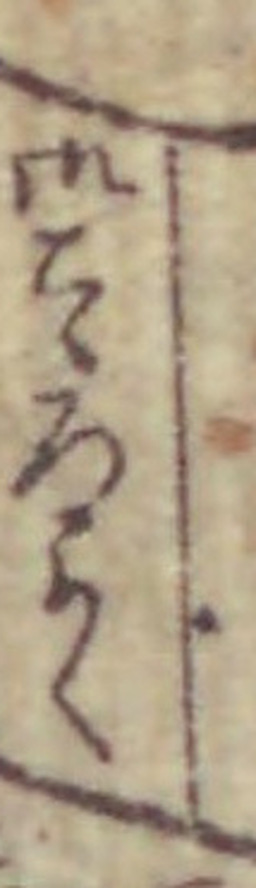御こゝろよく
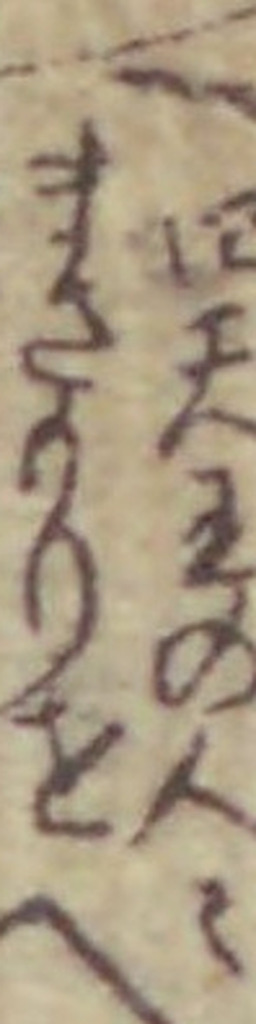まさもりを
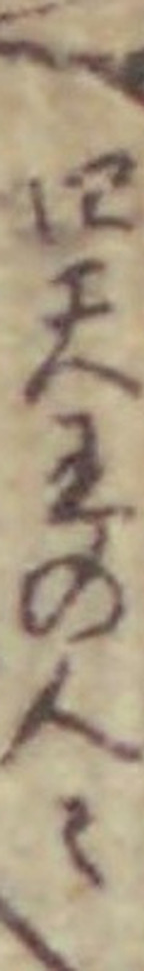四天王の人々
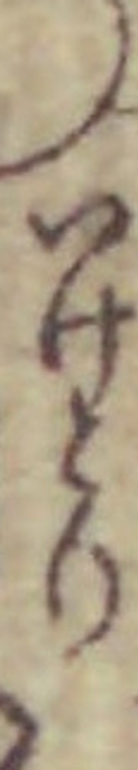いけとり
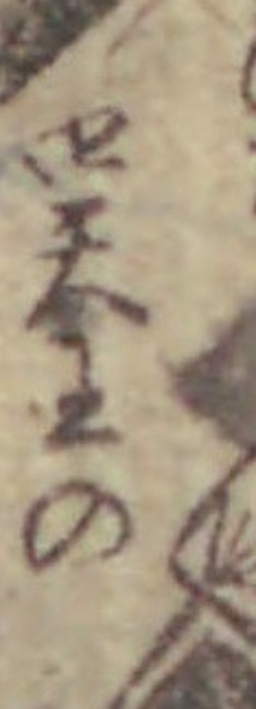四天王の
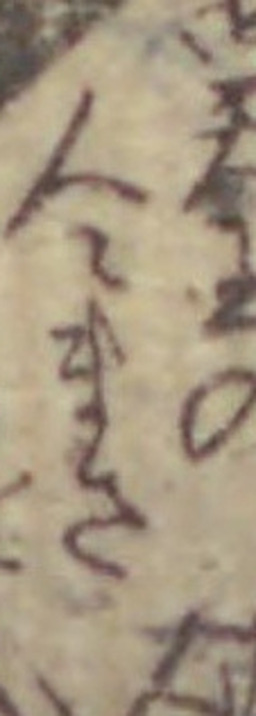人々まさ
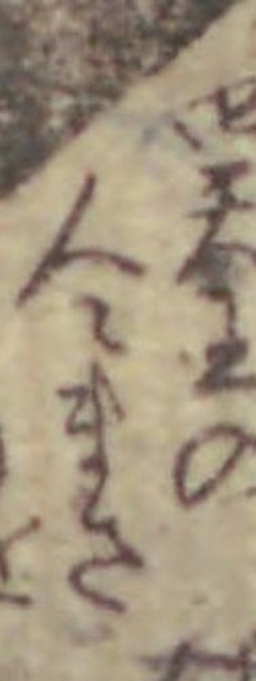人々まさ
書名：とんだ茶釜 2巻
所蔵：国立国会図書館 National Diet Library, JAPAN
